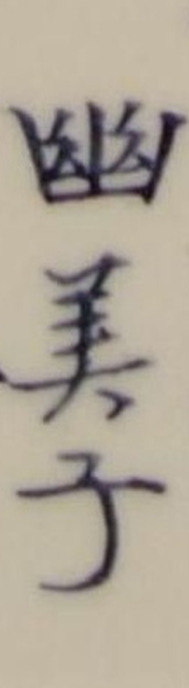幽美子
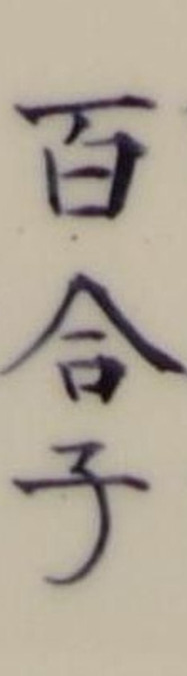百合子
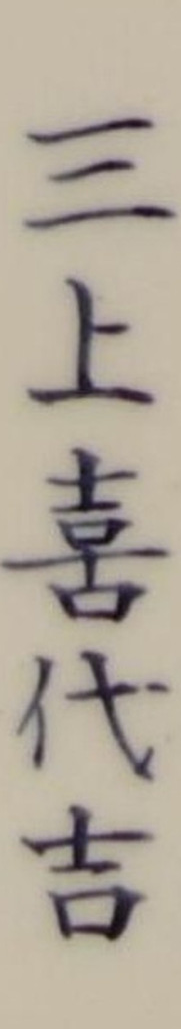三上喜代吉
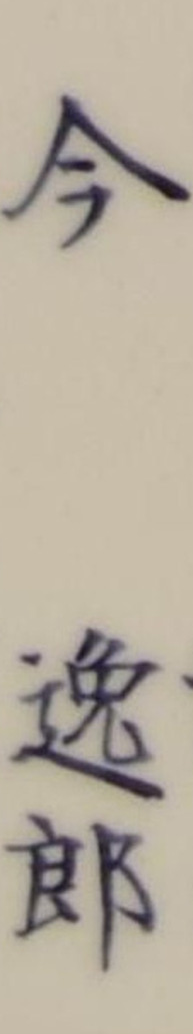今逸郎
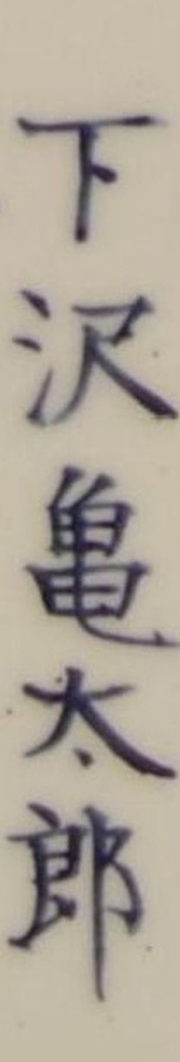下沢亀太郎
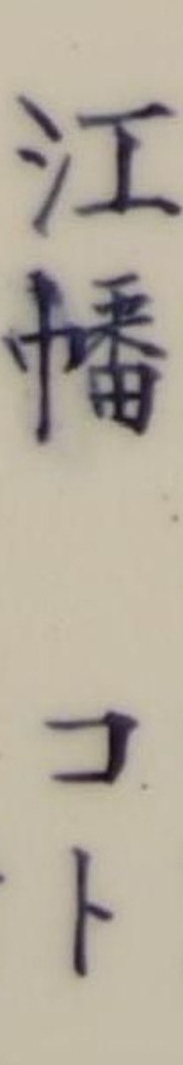江幡コト

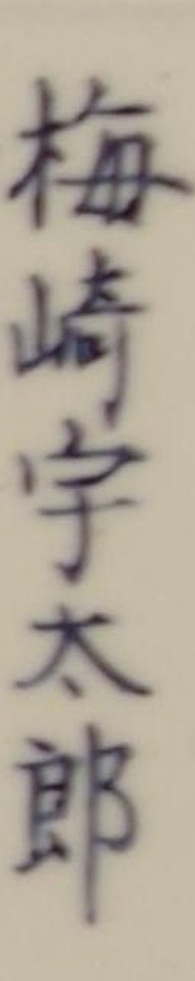梅崎宇太郎
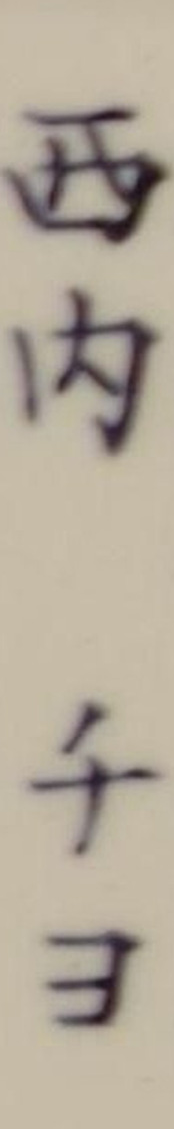西内チヨ
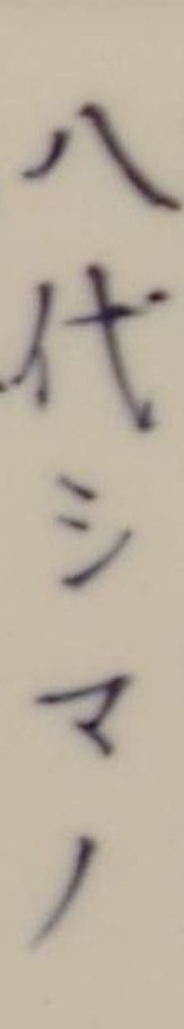八代シマノ
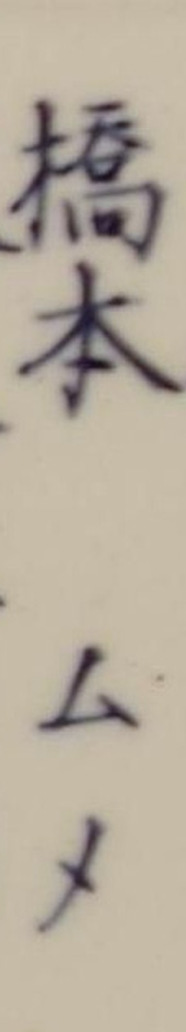橋本ムメ
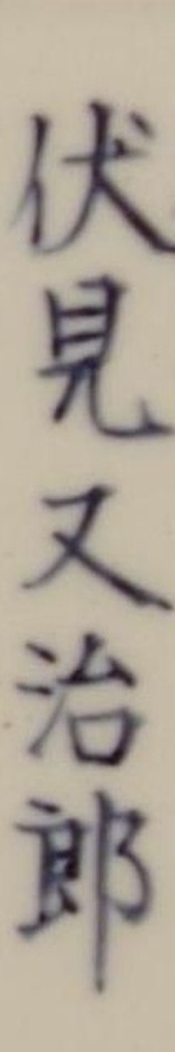伏見又治郎
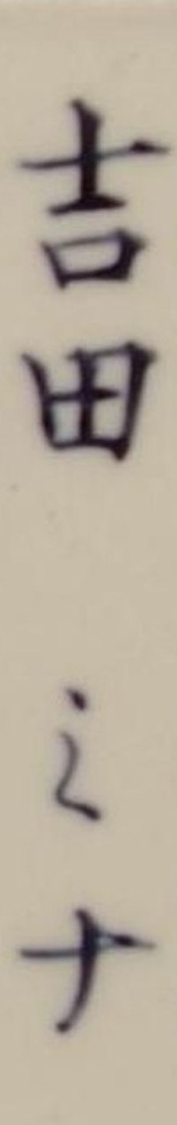吉田ミナ
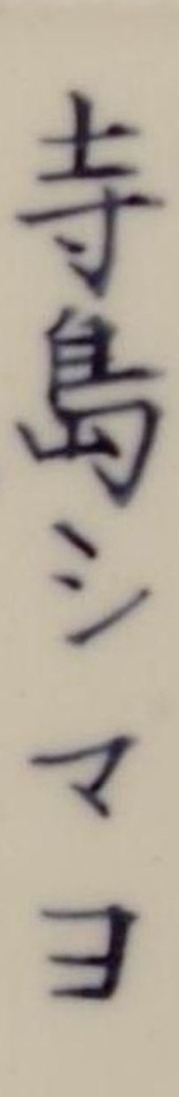寺島シマヨ
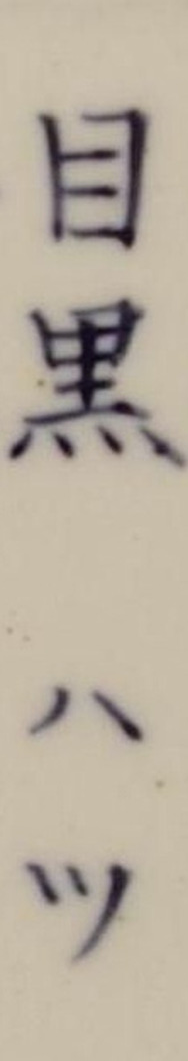目黒ハツ
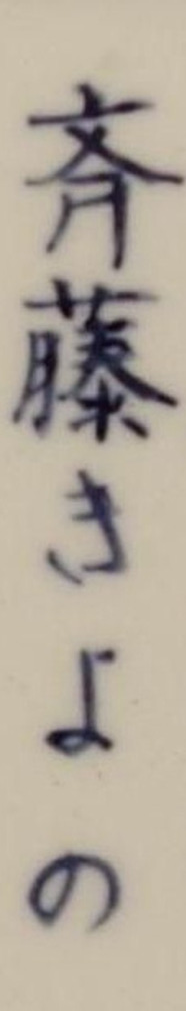斉藤きよの
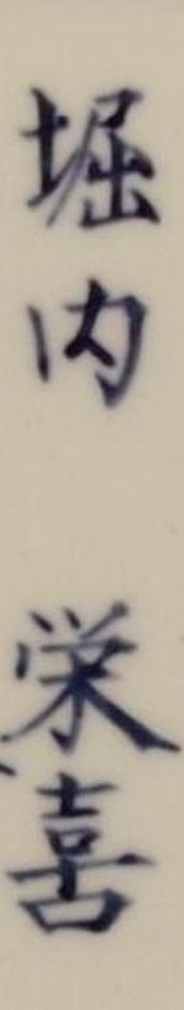堀内栄喜
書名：M~S
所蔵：高野山金剛峯寺
